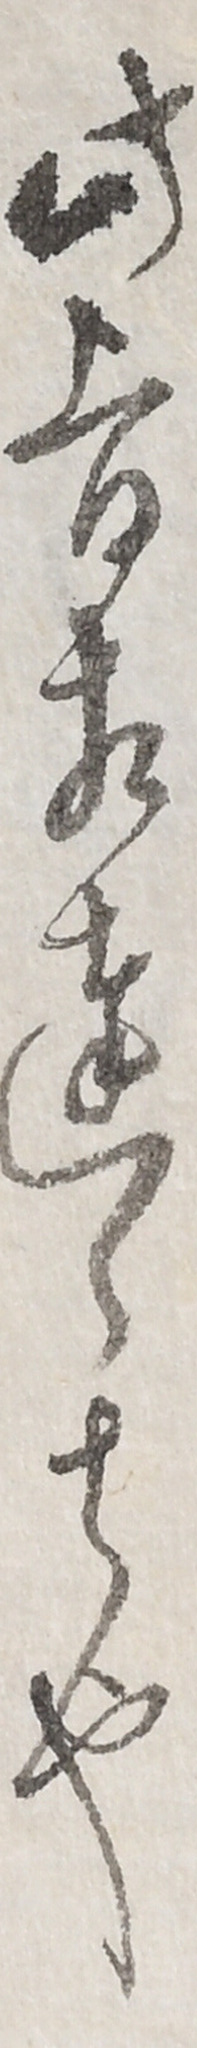此旨相達候はや
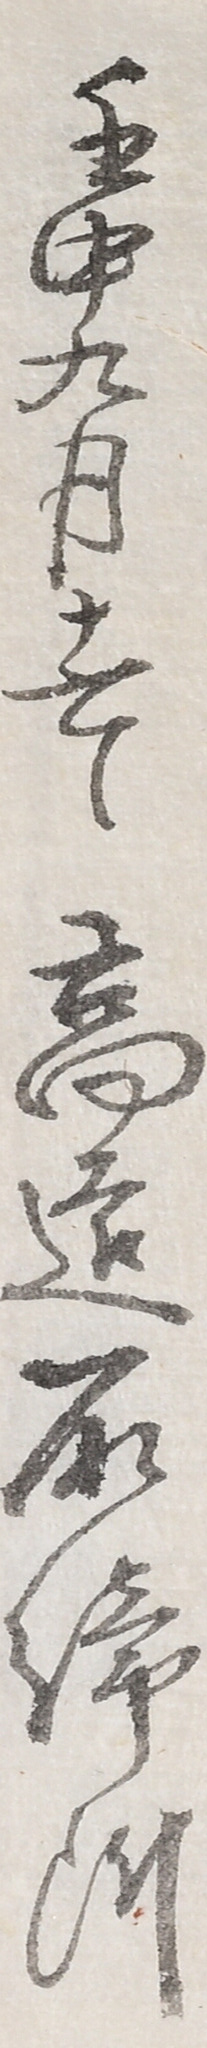壬申九月十六日高遠取締所
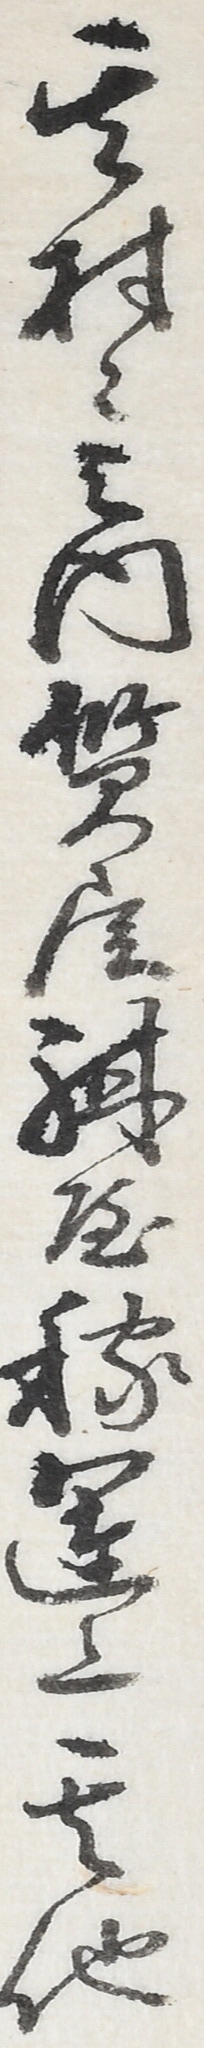其村々之内質屋紺屋稼運上其他
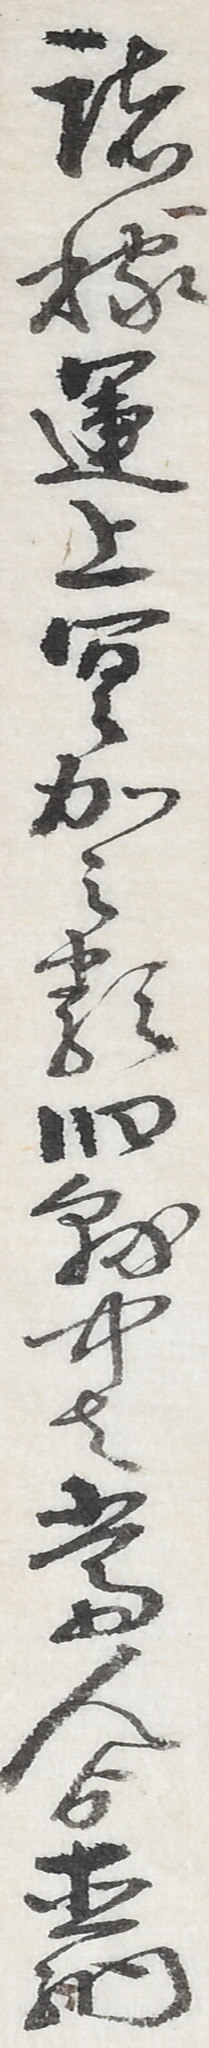諸稼運上冥加之類旧県中は当人より直納
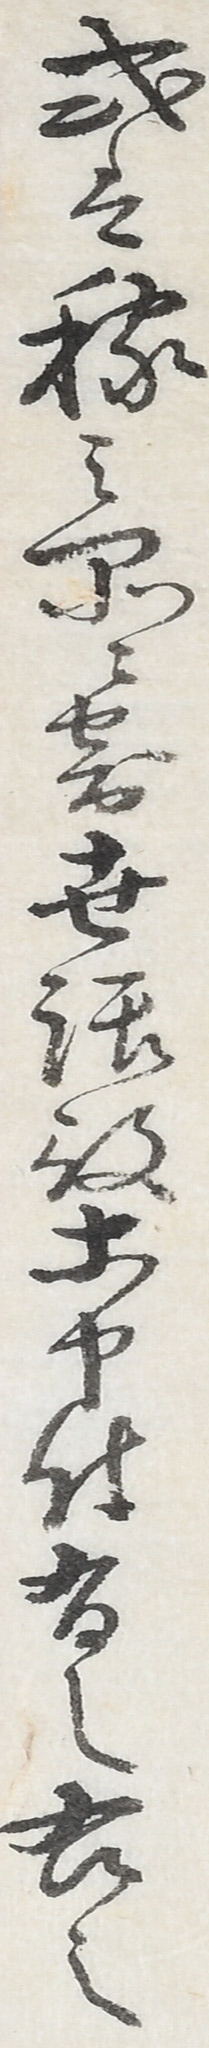或は稼之品々寄世話役等申付有之右之
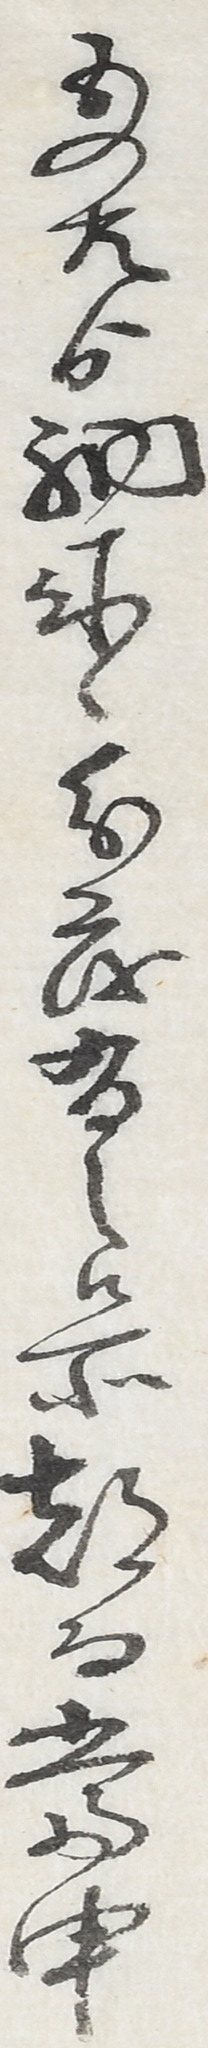もの共より納来候分も有之候所都而当申
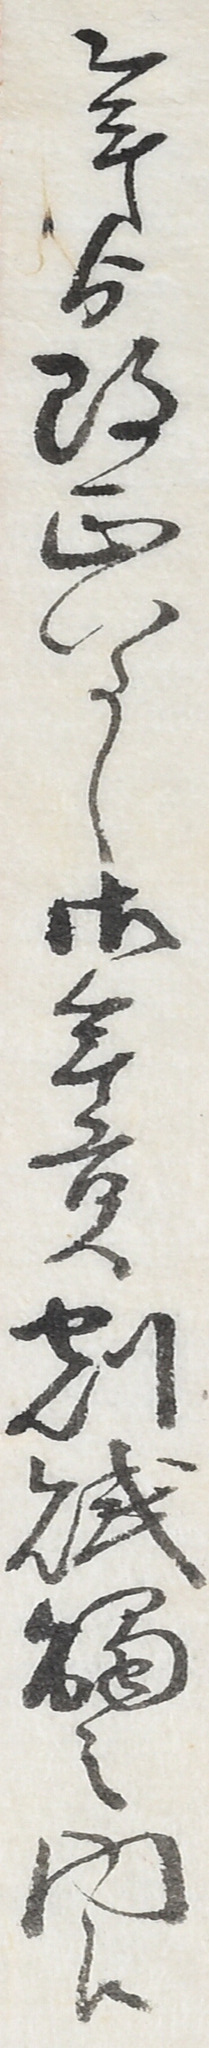年より改正いたし御年貢割賦触之内え
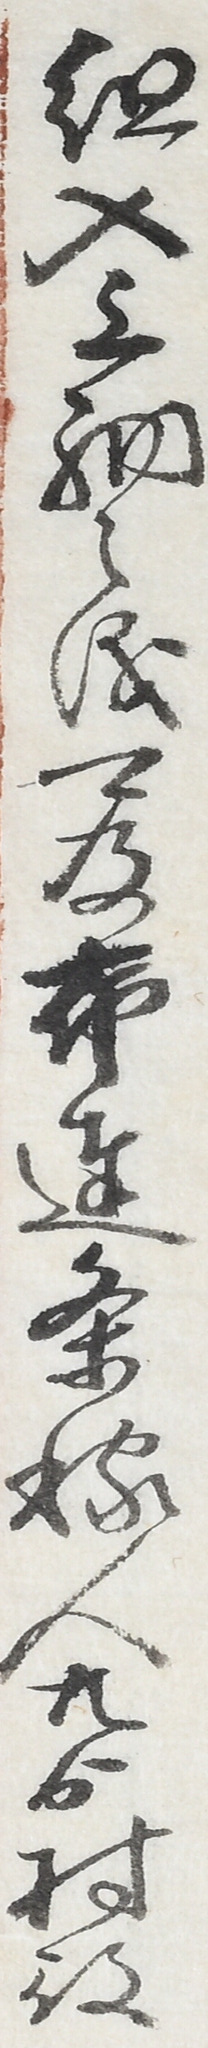組入上納之儀可及布達条稼人共より村役
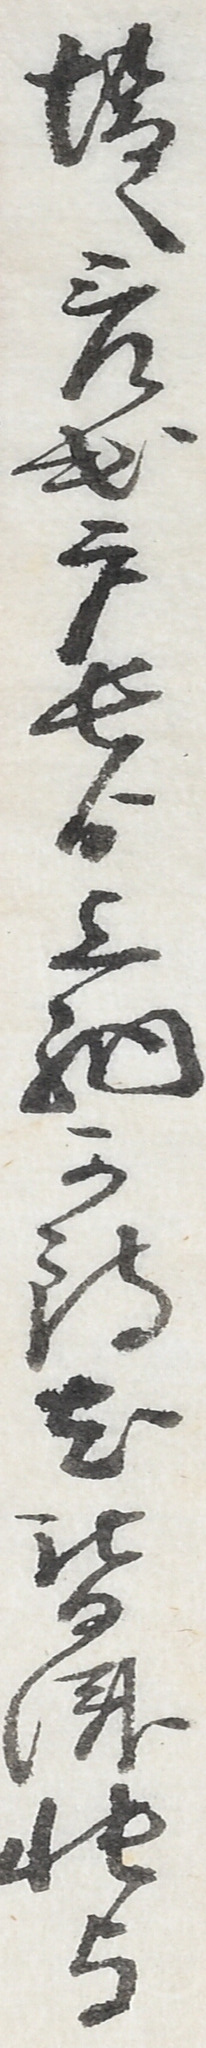場へ差出戸長より上納可致尤皆済帳と
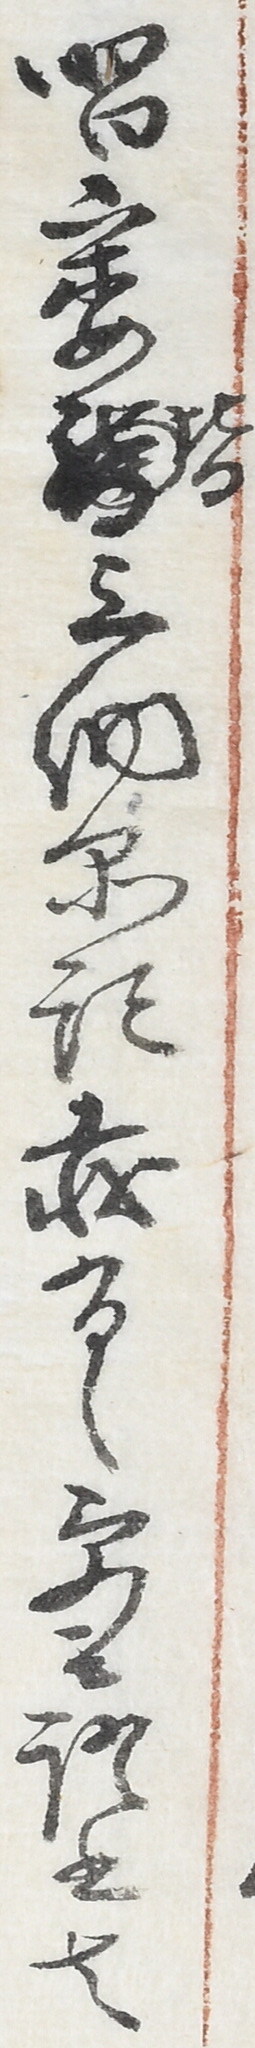唱悉皆上納品記載有之受取証書は

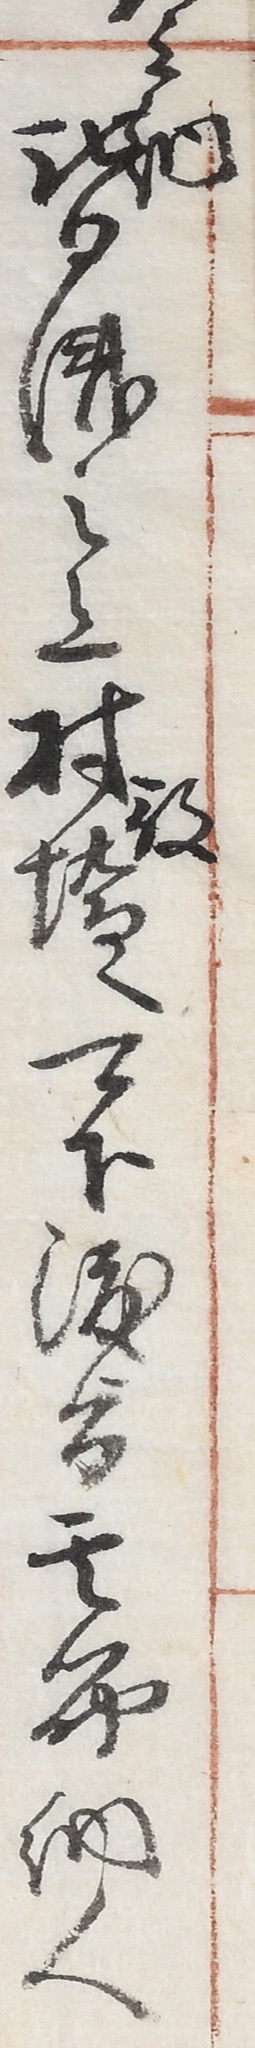金納皆済之上村役場へ可下渡旨其節納人
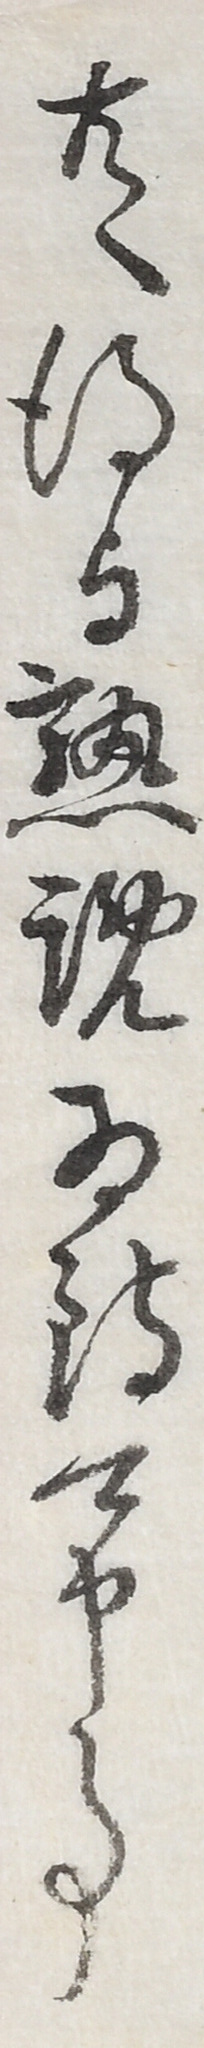共へ得と熟覧為致可申事
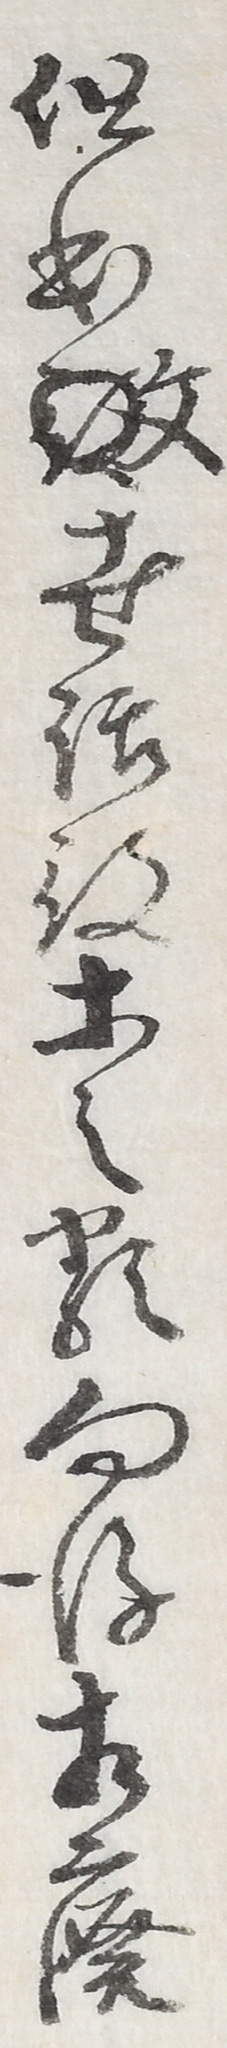但本文世話役等之類向後相廃
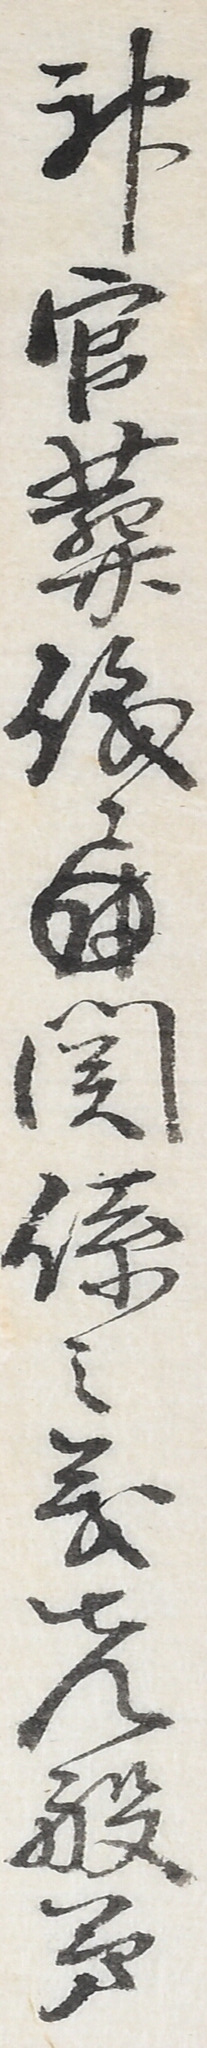神官葬儀ニ付関係之義先般第
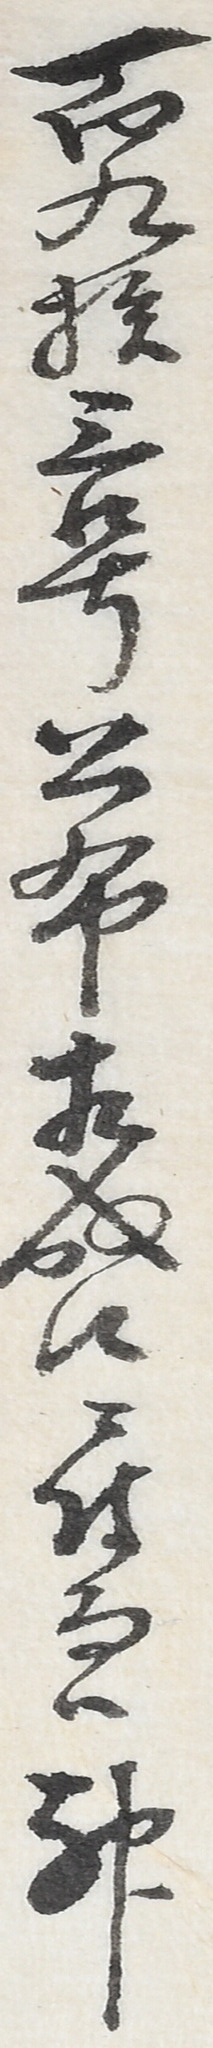百九拾三号公布相成候ニ付而ハ神
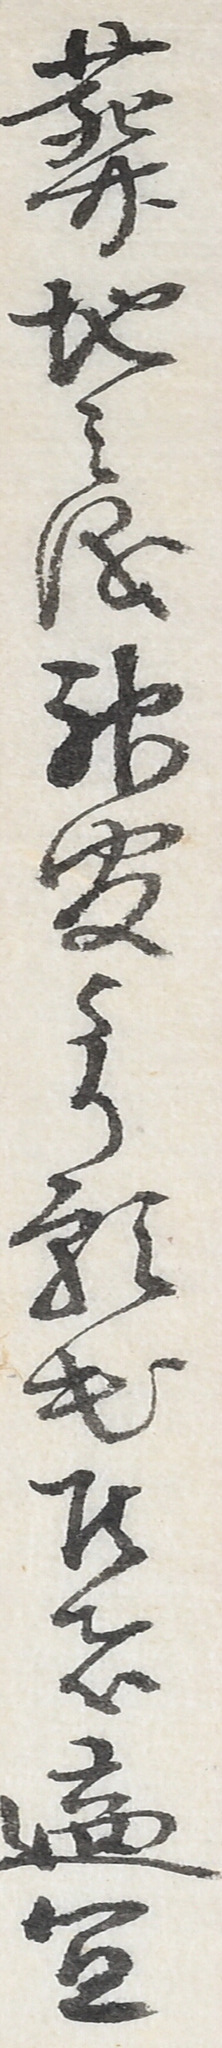葬地之儀神官より願出候者適宜
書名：壹番・御布告一式
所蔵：伊那市立高遠町図書館・合同会社AMANE
